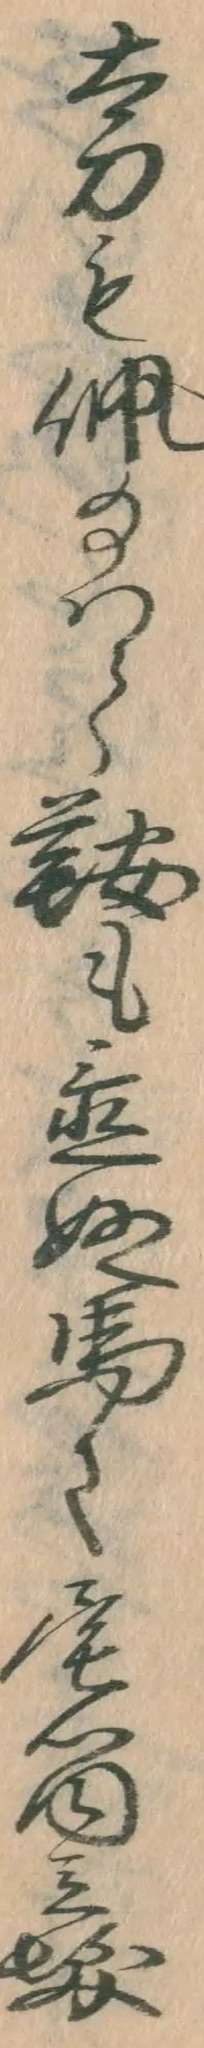太刀も佩玉ハて鞍も置ぬ馬に尾筒立髪
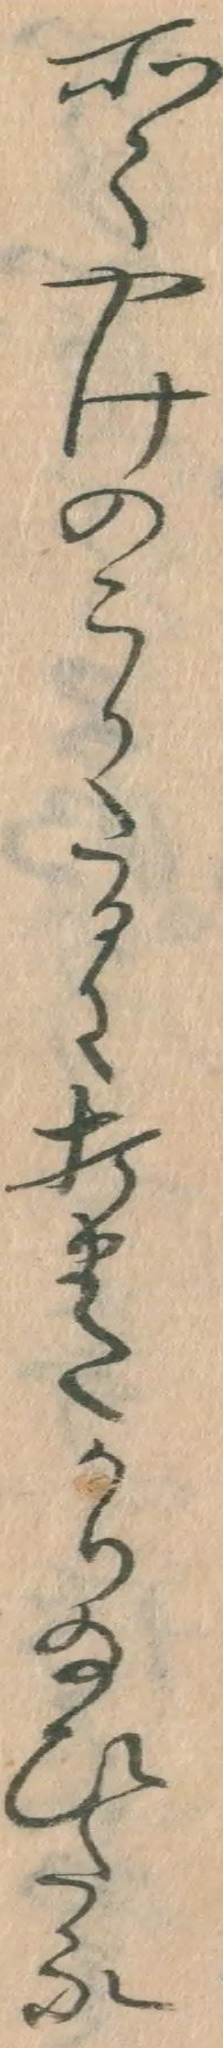所々やけのこりたるに打またかり玉ひたる
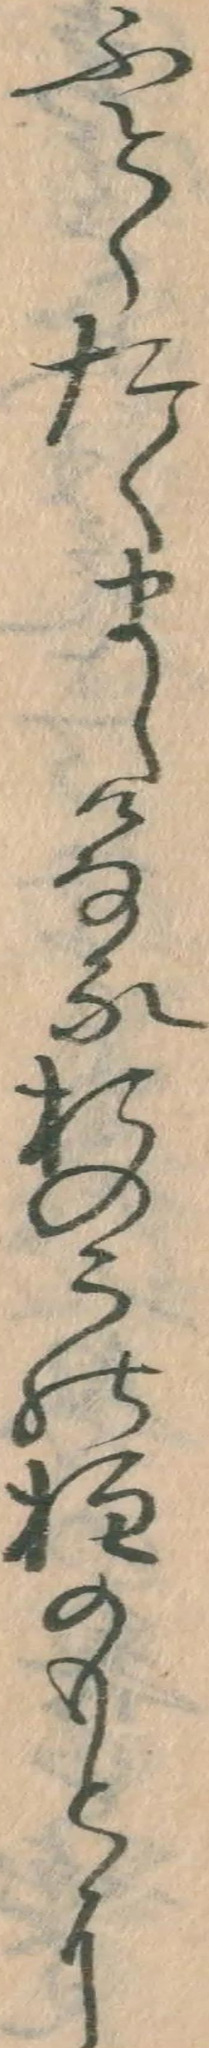ふとくたくましけなるおのこの柱のもとに
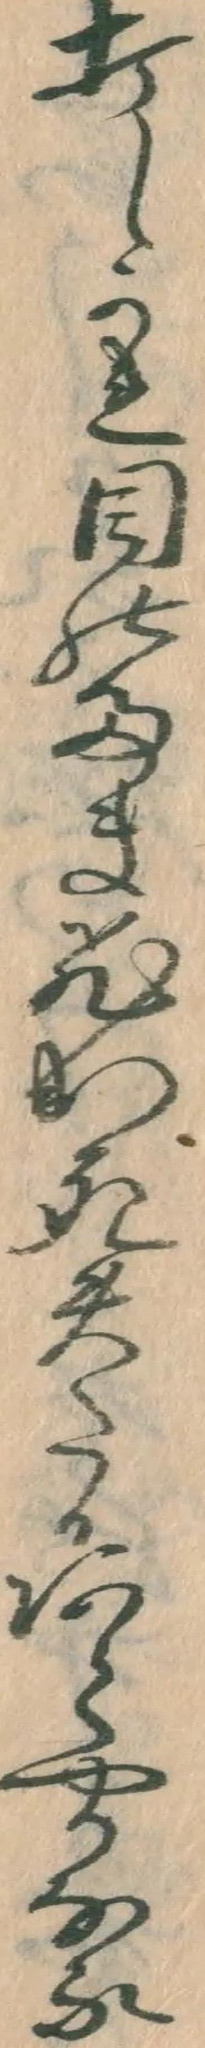打しかれ目のたま飛出死失たるあてやかなる
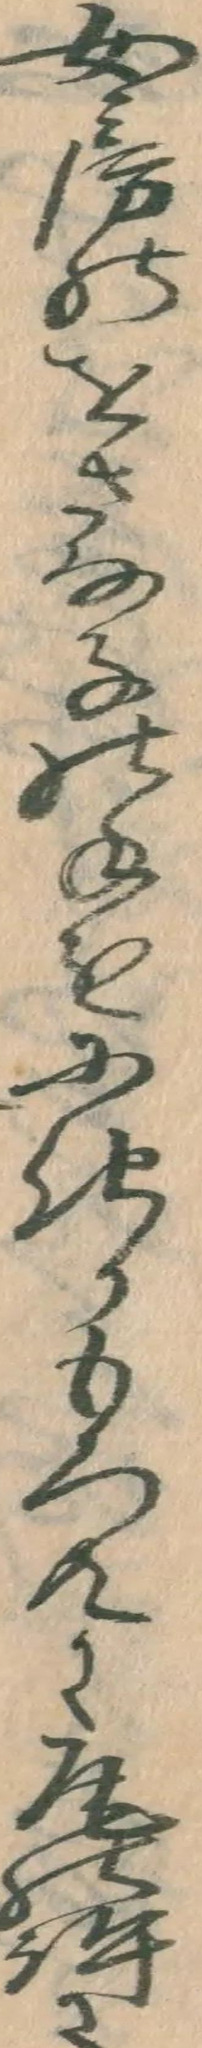女房のをさな子の手をにきりもろ共に瓦の許に
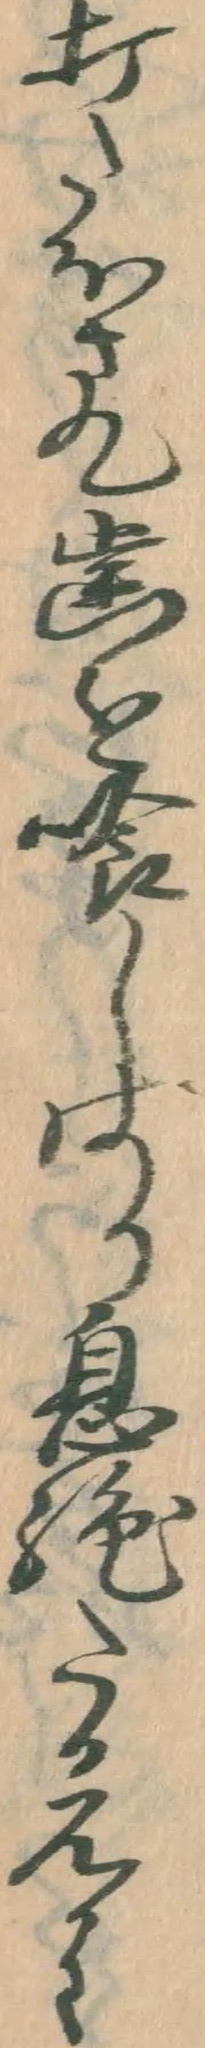打たほされ歯を喰しはり息絶たる見るに

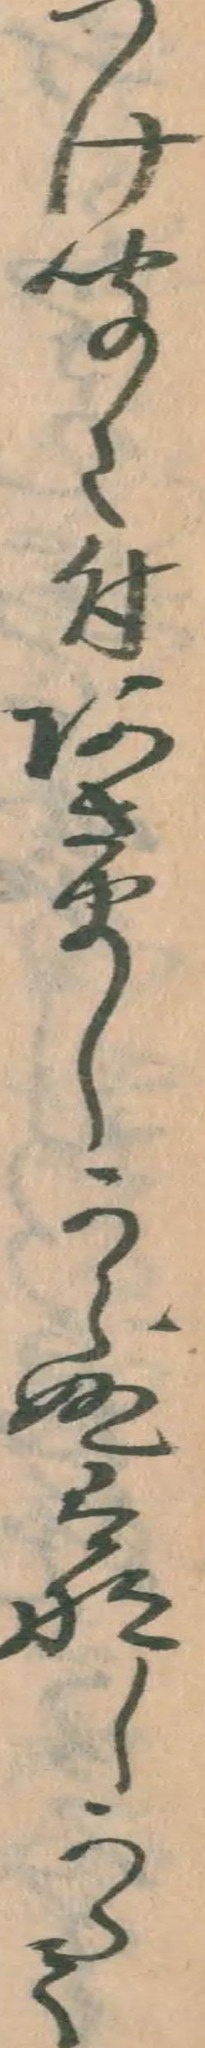つけ聞に付あさましからぬはなしかたに
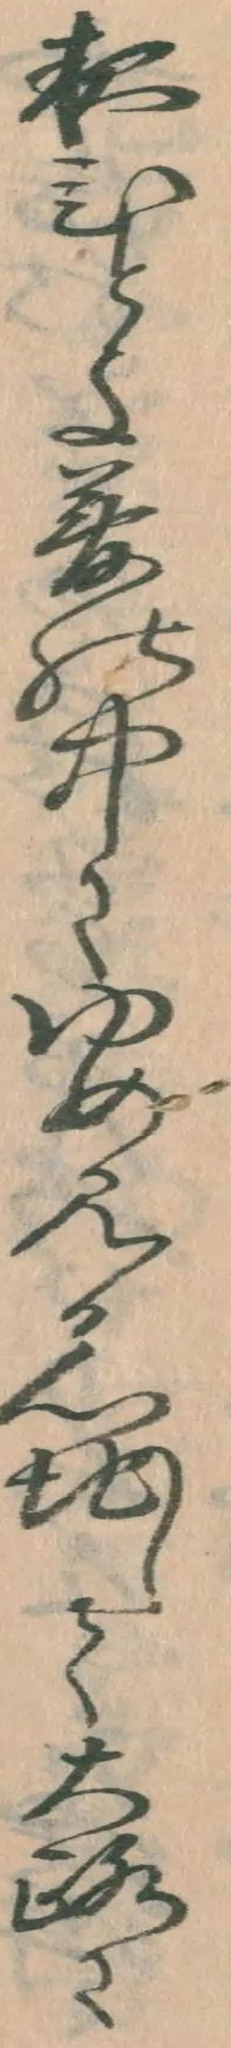夜ひとよ夢の中にゆめ見る心地して大路に
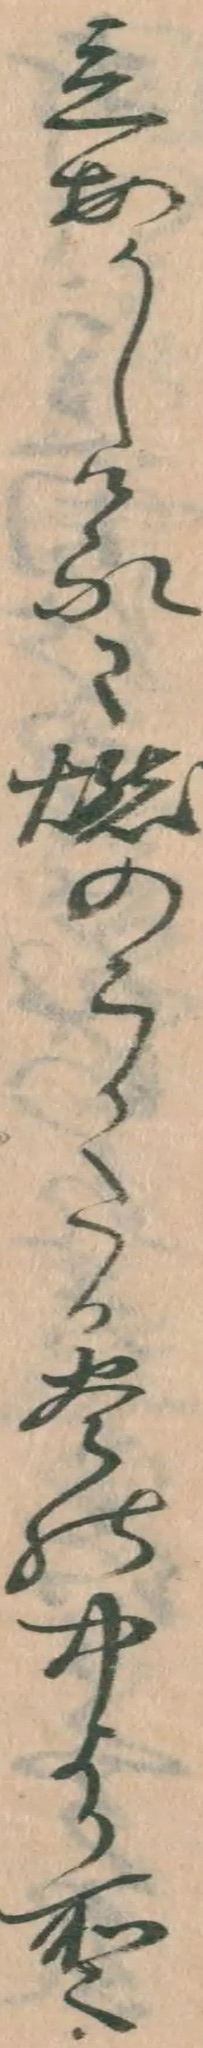立あかしけるに燃のこりたる炎の中より所々
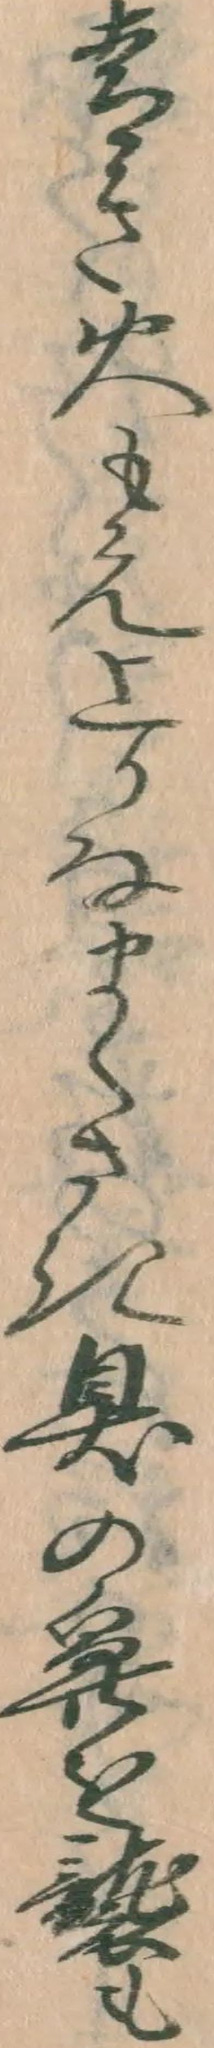青き火もえ上りなまくさき臭の鼻を襲も
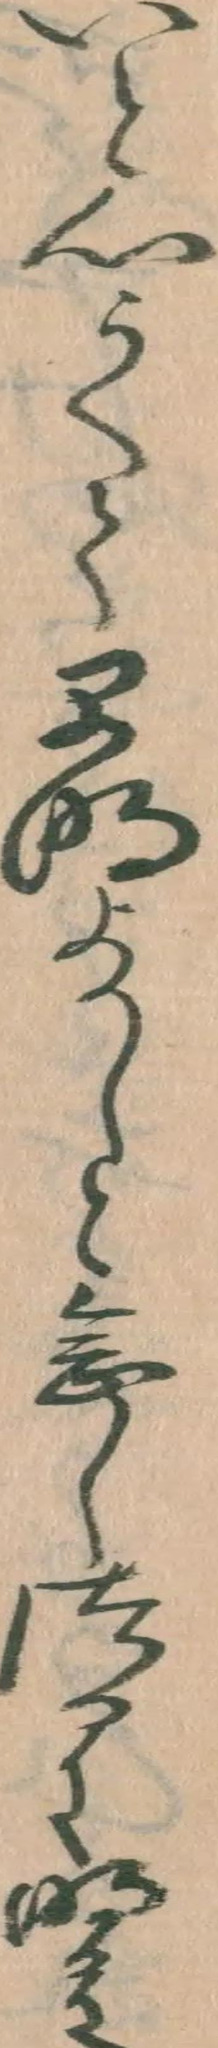いと心うくて早明よかしと念しつるに明るに
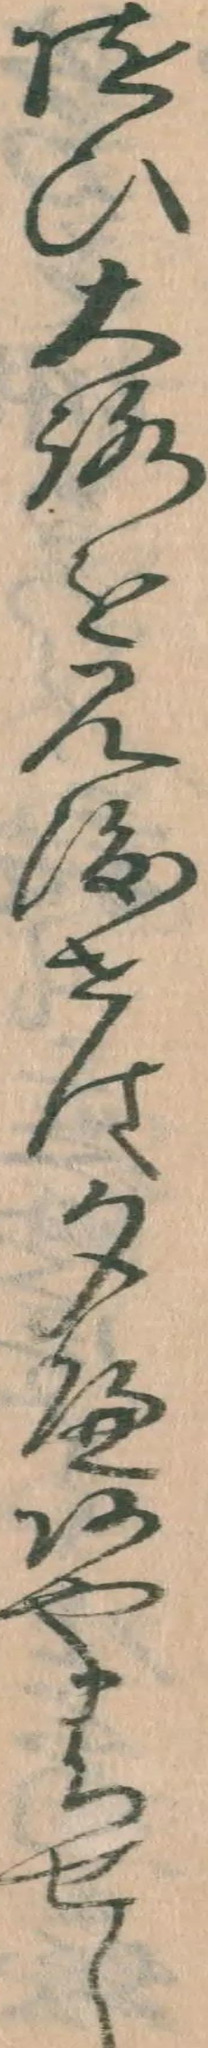随ひ大路を見渡せは夕へあやまちせし
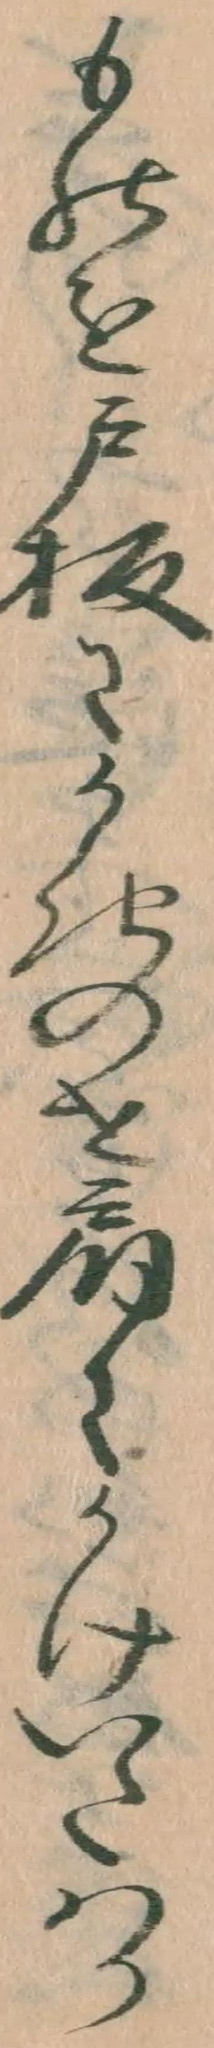ものを戸板にかきのせ肩にかけいたハり
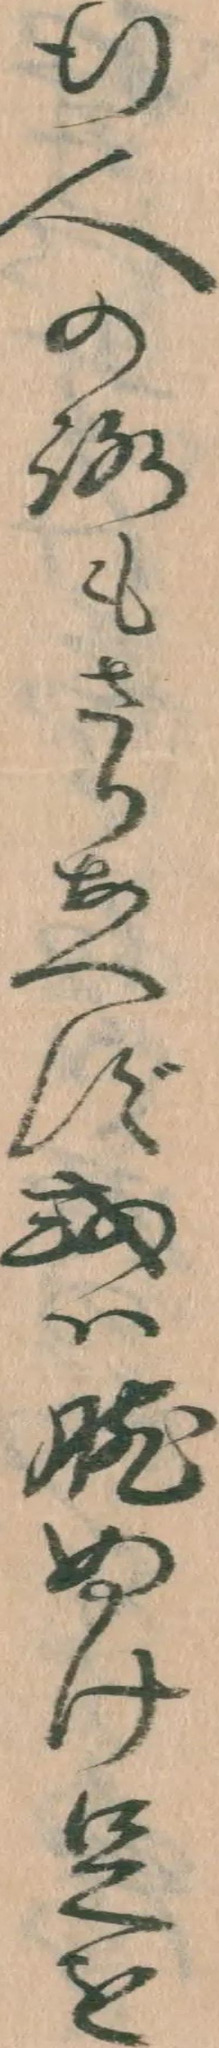行人の路もさりあへず或ハ腕ぬけ足を
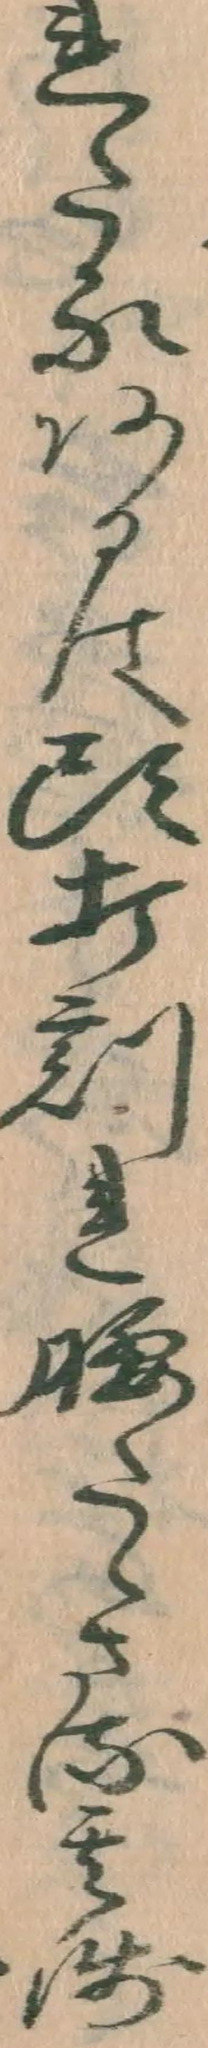れたるあるは頭打割れ腰たヽさる其浅
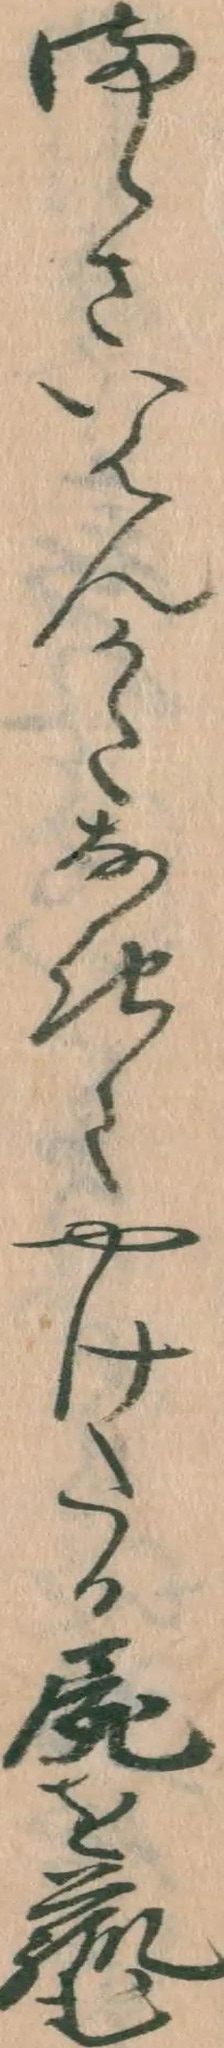ましさいはんかたなきにやけたる屍を菰む
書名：麗斎叢書. 20
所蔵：国立国会図書館 National Diet Library, JAPAN
